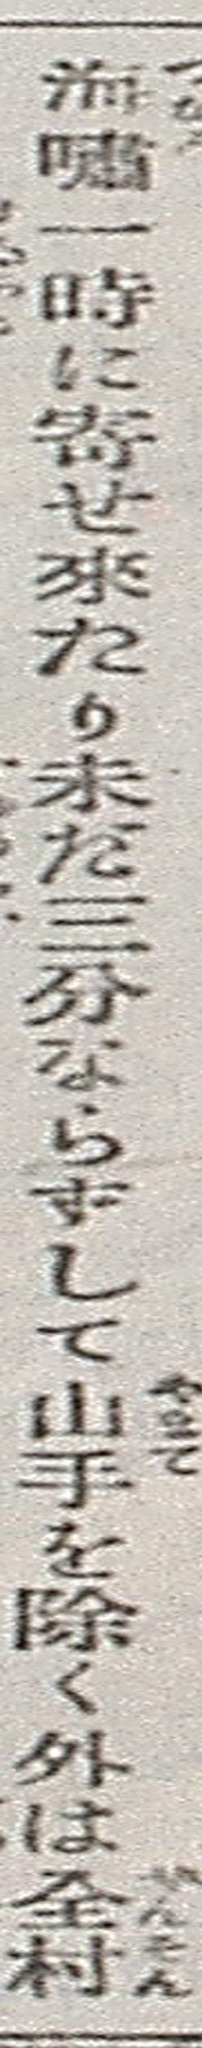海嘯一時に寄せ来たり未だ三分ならずして山手を除く外は全村
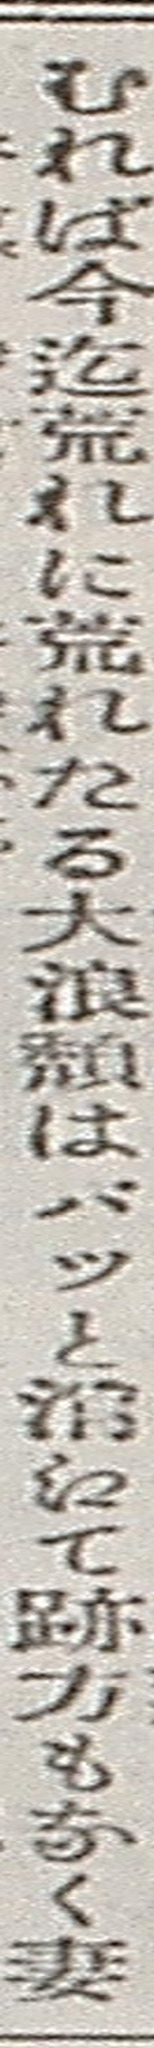むれば今迄荒れに荒れたる大浪頽はパッと消？えて跡方もなく妻
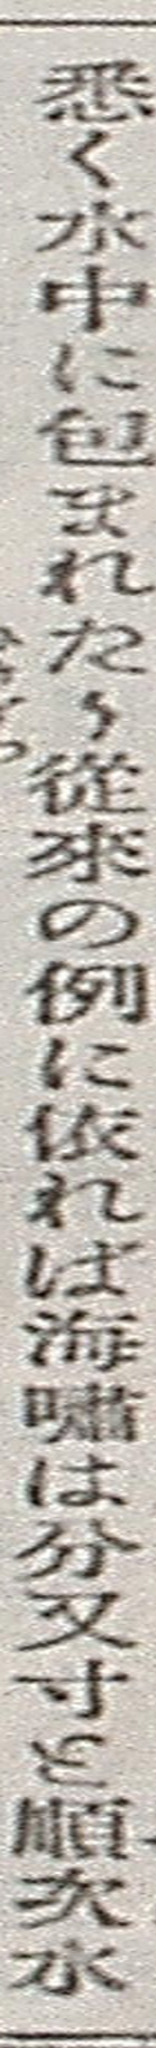悉く水中に包まれたり従来の例に依れば海嘯は分又寸と順次水
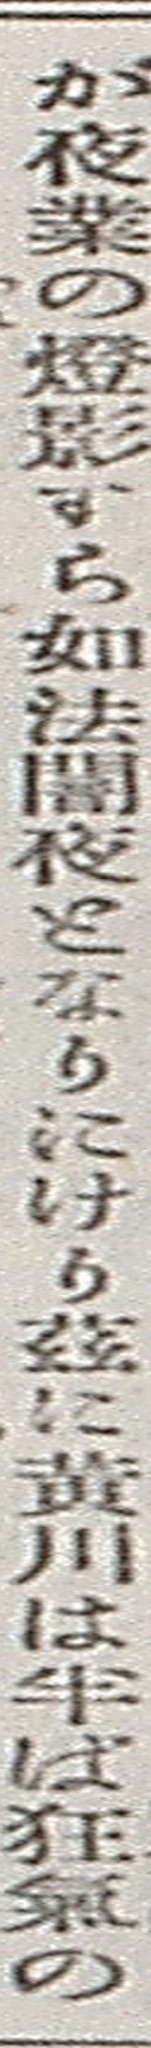が夜業の灯影すら如法闇夜となりにけり茲に黄川は半ば狂気の
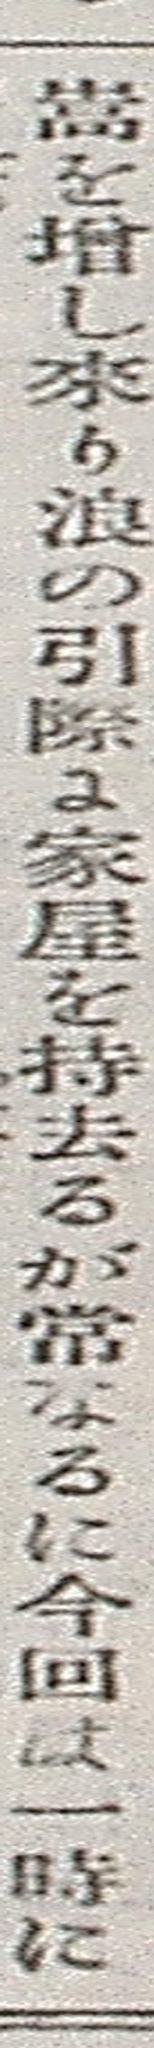嵩を増し来り浪の引際に家屋を持去るが常なるに今回は一時に
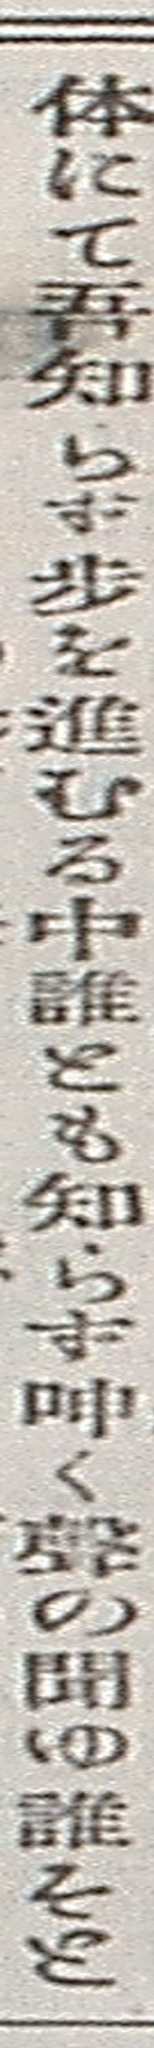体にて吾知らず歩を進むる中誰とも知らず呻く声の聞ゆ誰そと
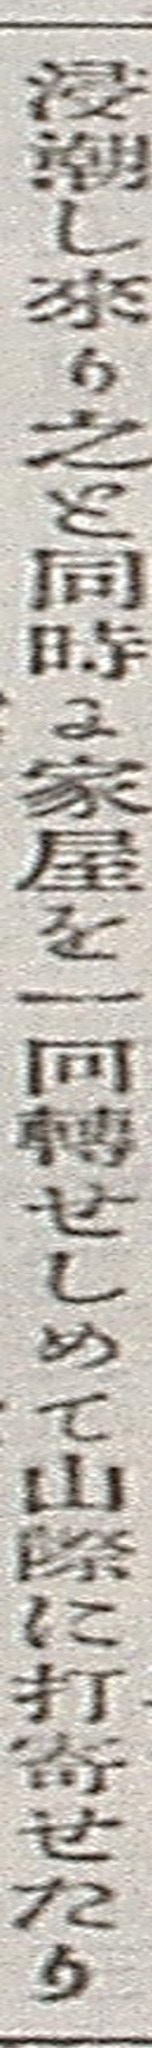浸潮し来り之と同時に家屋を一回転せしめて山際に打寄せたり
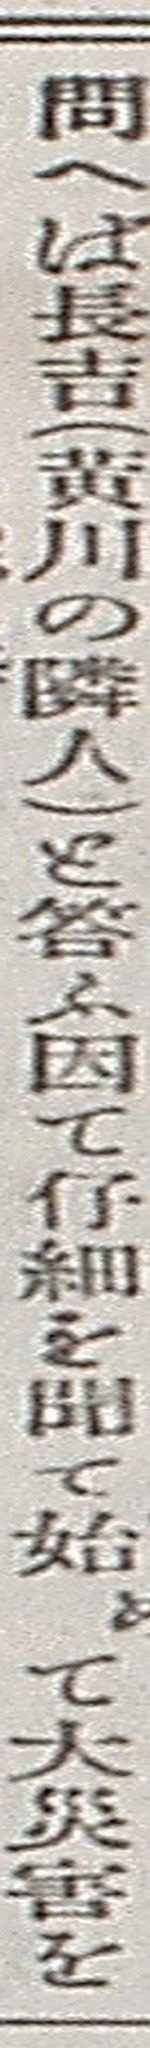問へば長吉）と答ふ因て仔細を聞て始めて大災害を
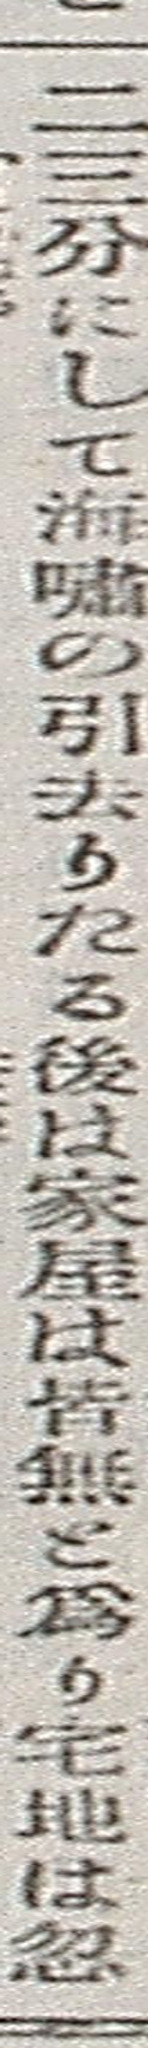二三分にして海嘯の引去りたる後は家屋皆無と為り宅地は忽
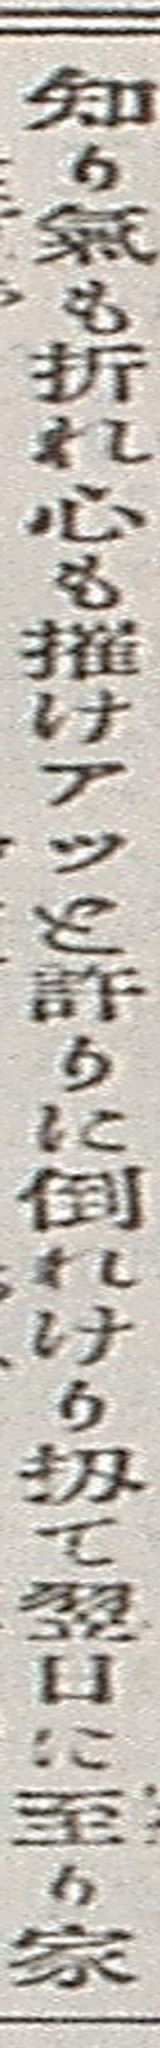知り気も折れ心も摧けアツと許りに倒れけり扨て翌日に至り家
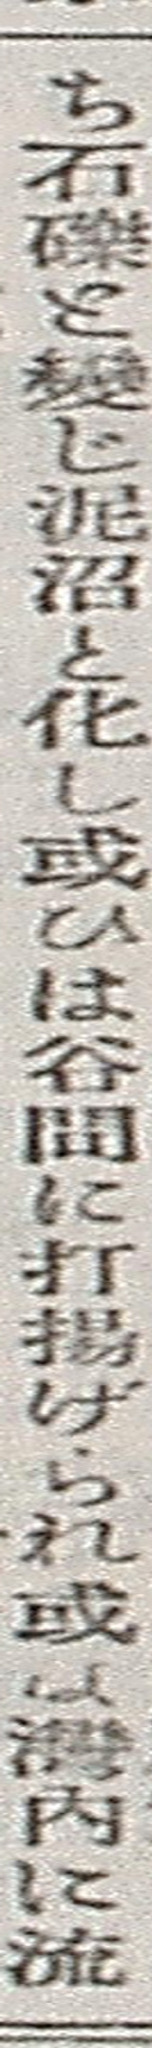ち石礫と変じ泥沼と化し或ひは谷間に打揚げられ或は湾内に流
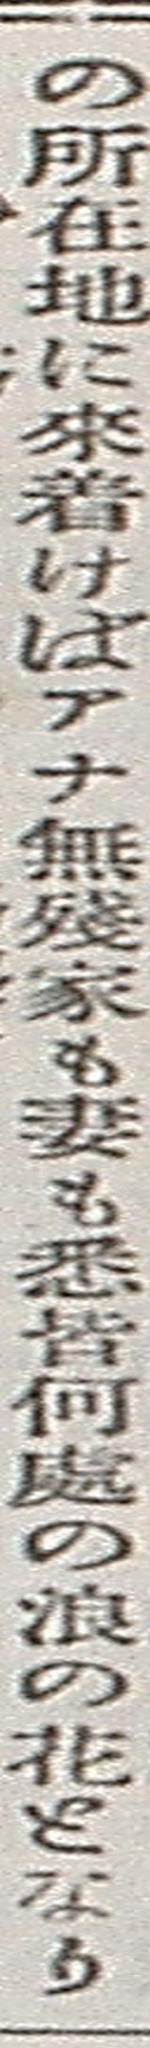の所在地に来着けばアナ無残家も妻も悉皆何処の浪の花となり
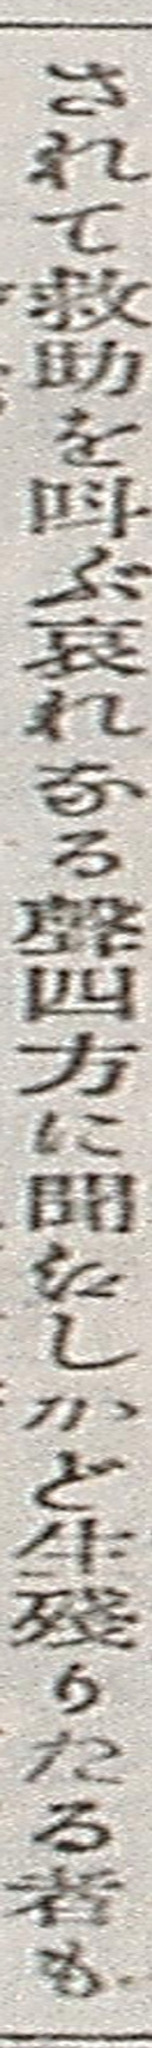されて救助を叫ぶ哀れなる声四方に聞えしかど生残りたる者も
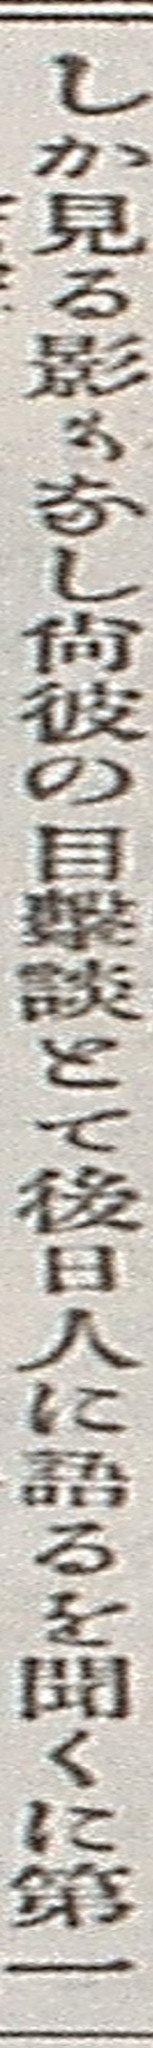しか見る影もなし尚彼の目撃談とて後日人に語るを聞くに第一
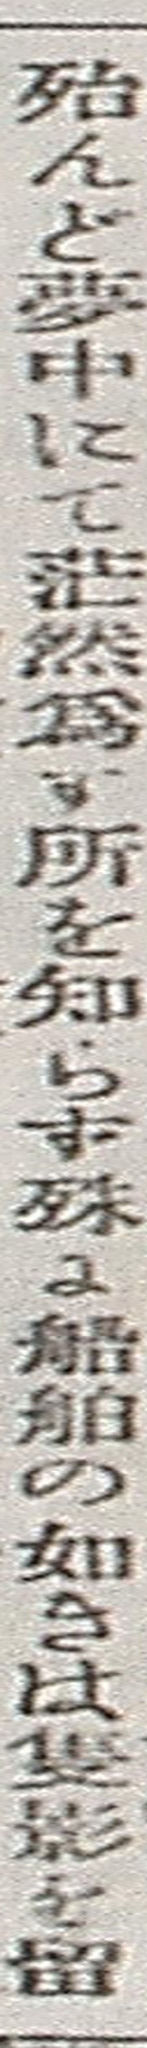殆んど夢中にて茫然為す所を知らず殊に船舶の如きは隻影を留
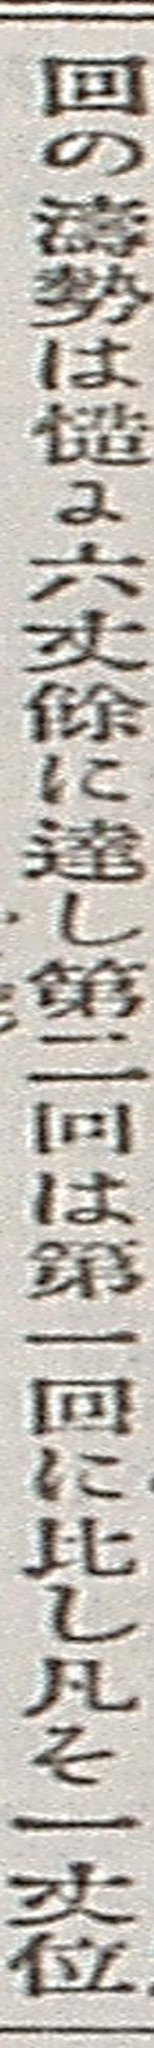回の濤勢は慥に六丈余に達し第二回は第一回に比し凡そ一丈位
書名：風俗畫報臨時増刊第百二十號　大海嘯被害録（下）
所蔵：東京大学地震研究所図書室 Earthquake Research Institute Library, The University of Tokyo, JAPAN
